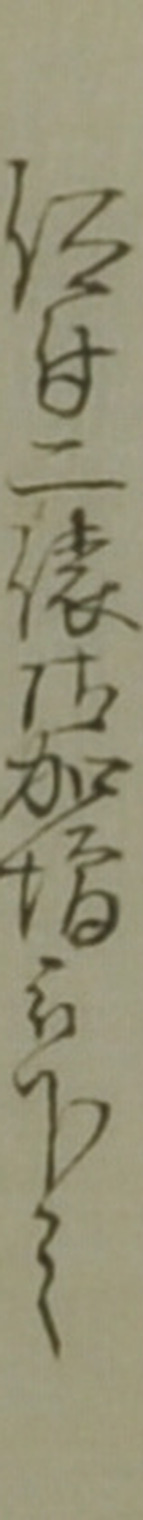仰付二俵御加増被下之
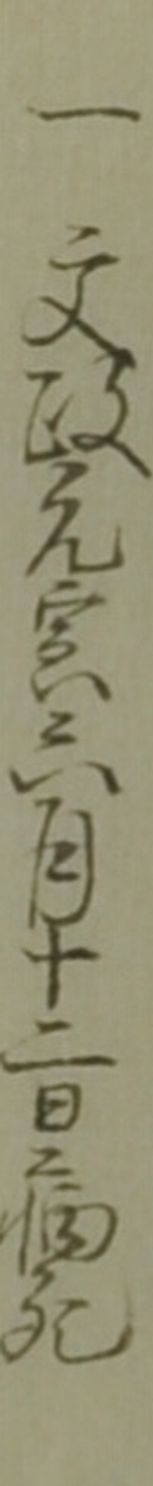一文政元寅六月十二日病死
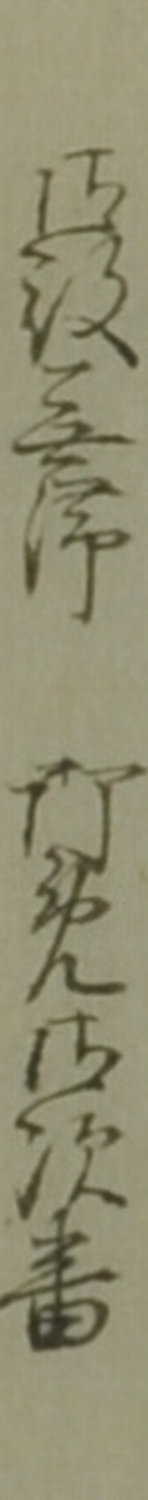御役無滞御免御次番

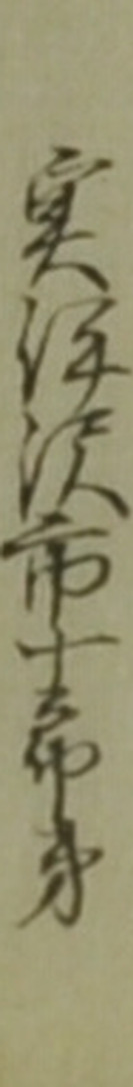実伊沢市十郎弟
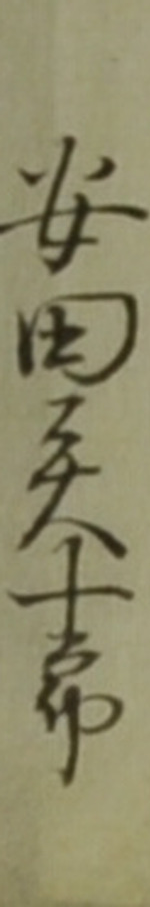安田矢十郎
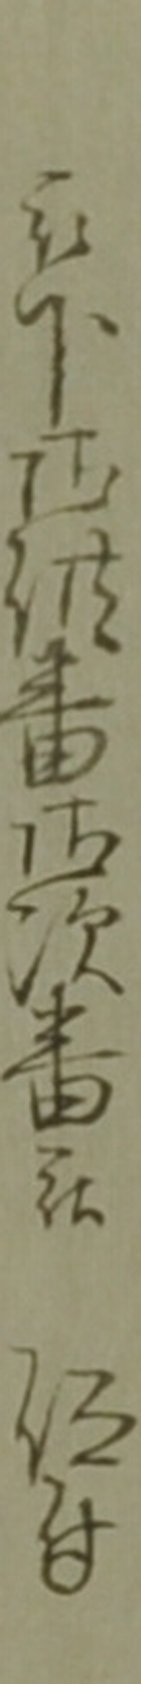被下御供番御次番被仰付
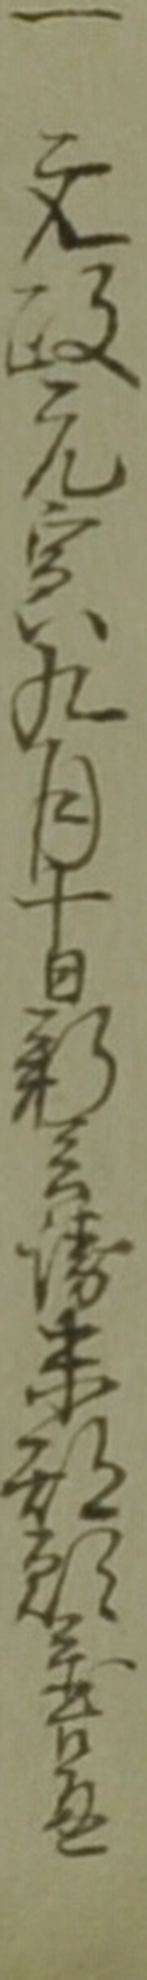一文政元寅九月十日新兵衛末期願置候通
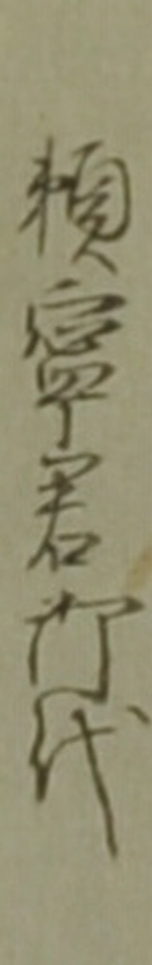頼寧君御代
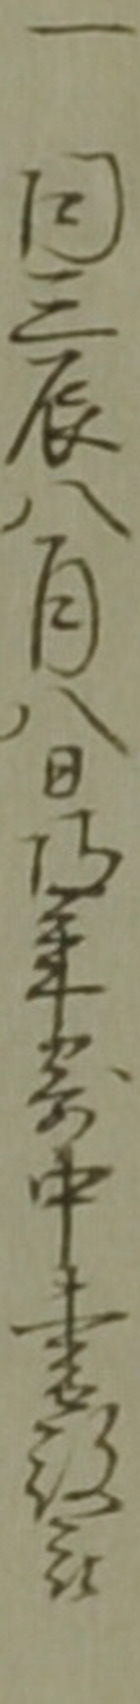一同三辰八月八日御年寄中書役被仰付
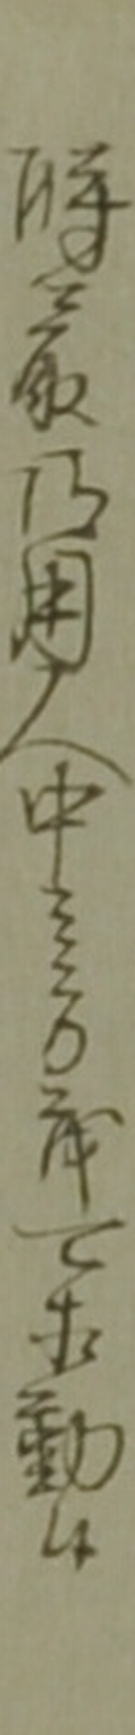時ニ取御用人中之方茂可相勤候
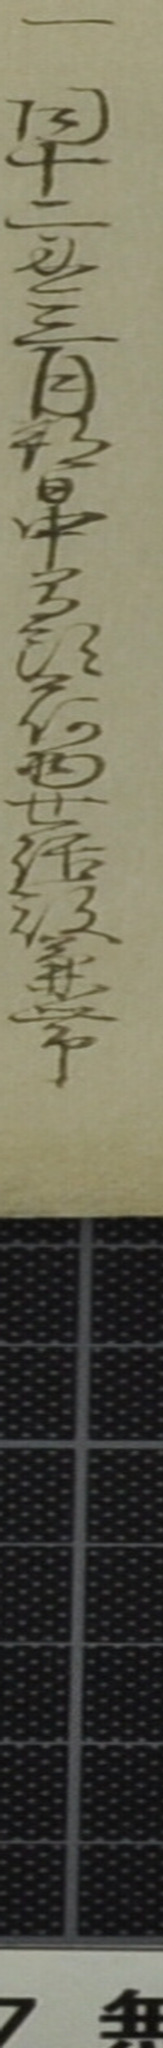一同十二丑三月朔日中間頭荷物世話役兼帯
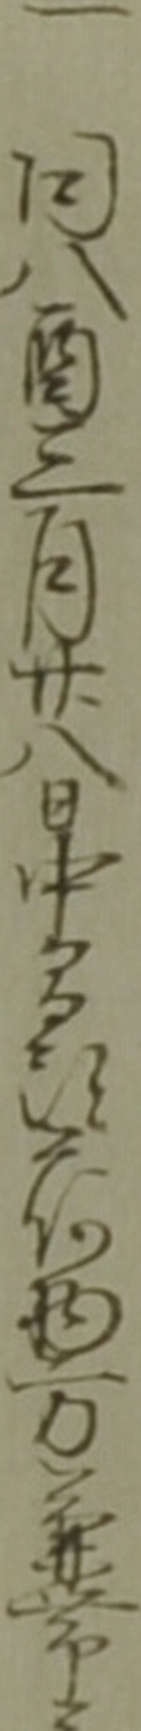一同八酉三月廿八日中間頭荷物方兼帯被仰付
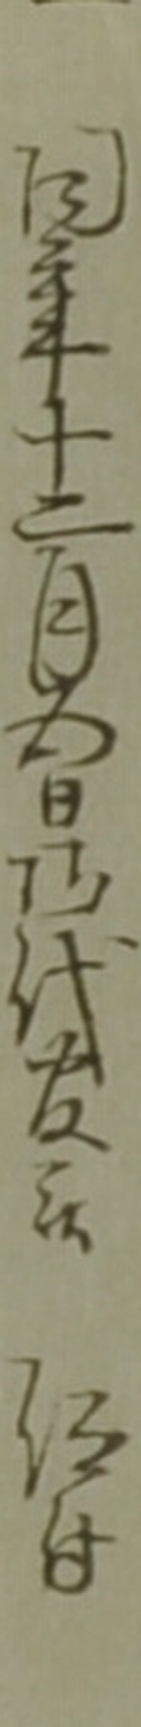一同年十二月五日御代官被仰付
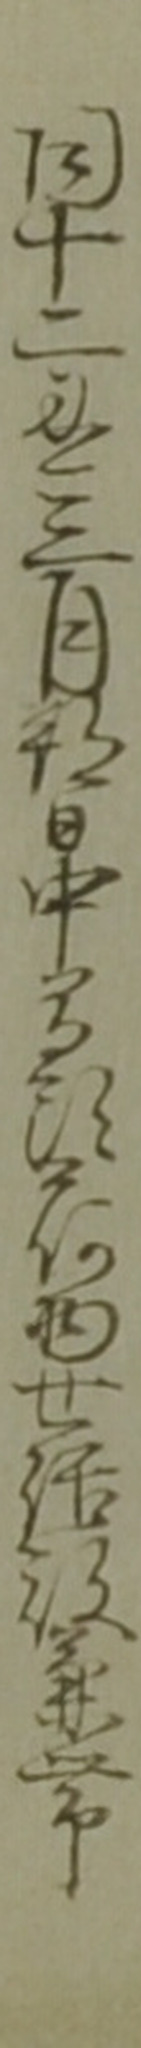一同十二丑三月朔日中間頭荷物世話役兼帯
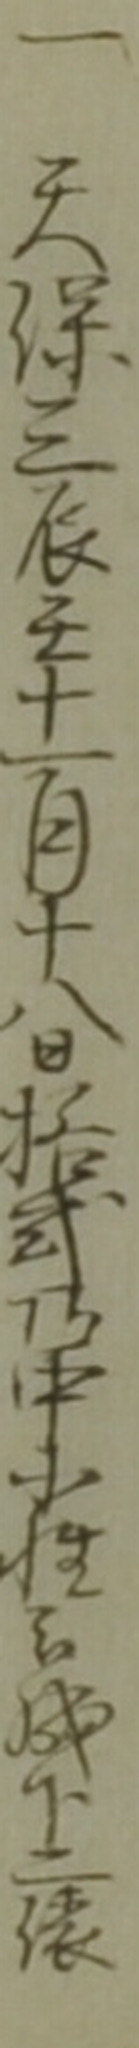一天保三辰閏十一月十八日格式御中小性被成下二俵
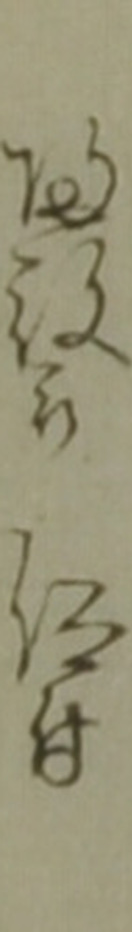帰役被仰付
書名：無足諸士勤仕録（一）
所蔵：伊那市立高遠町図書館・合同会社AMANE
